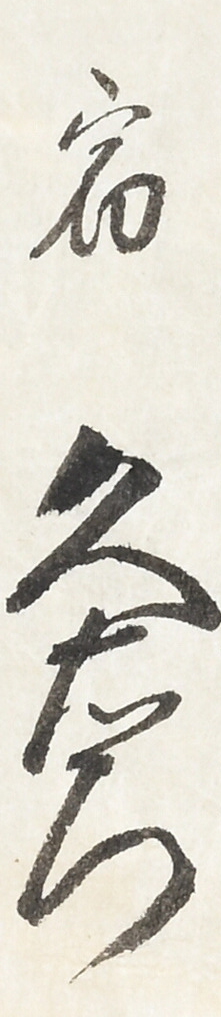宿久右衛門
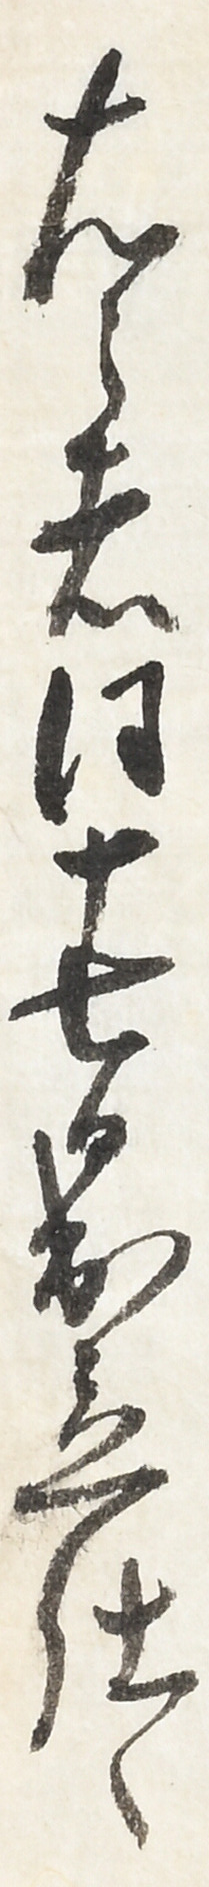右之者同十七日出立仕候

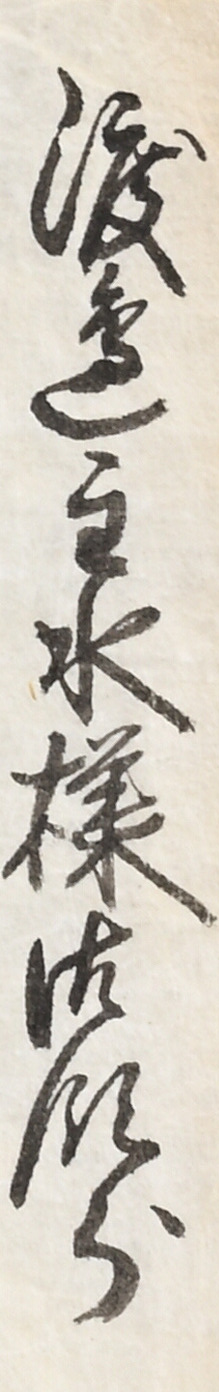渡辺主水様御領分
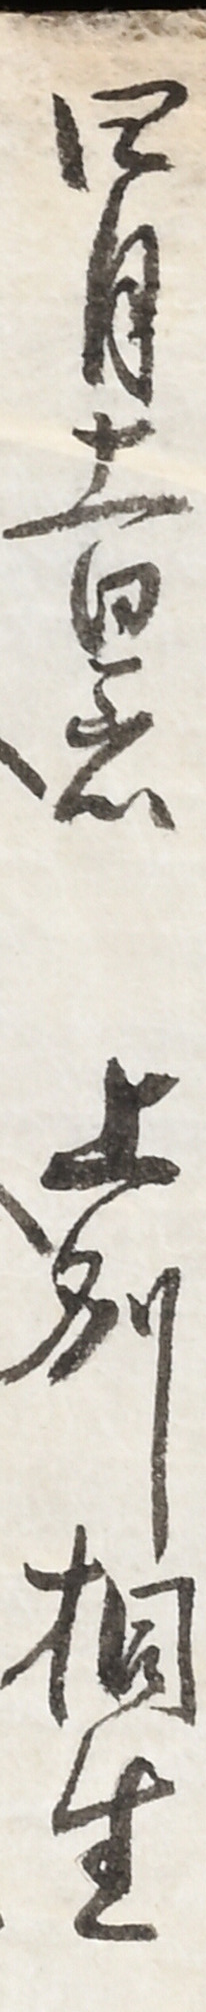四月十一日着上州相生
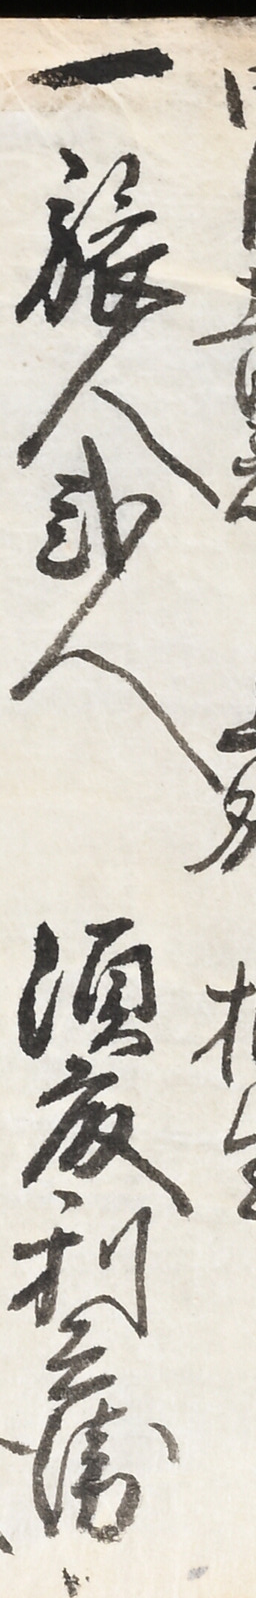一旅人弐人須藤利兵衛・
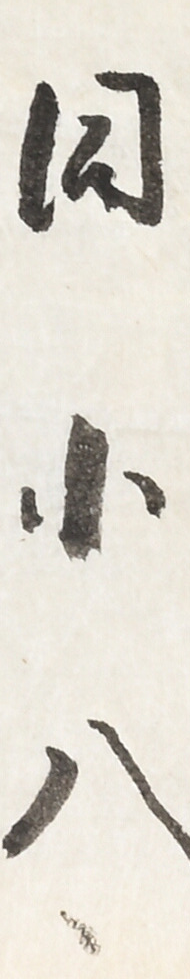同小八・
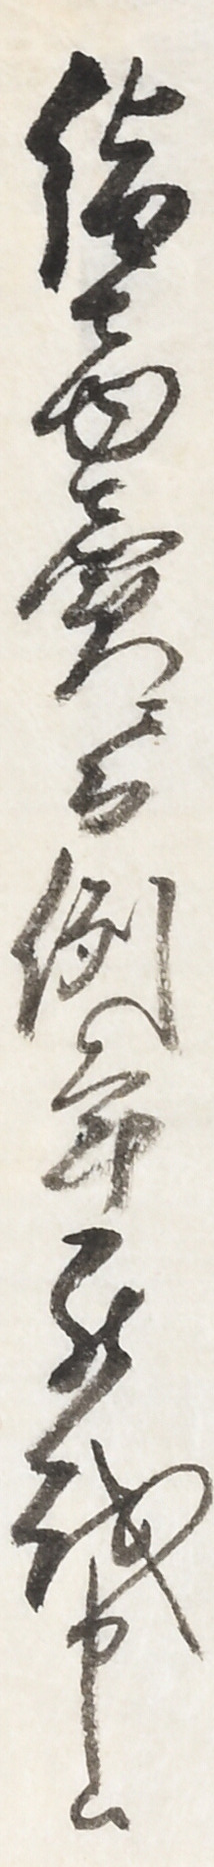絹商売ニ而例年罷越申候
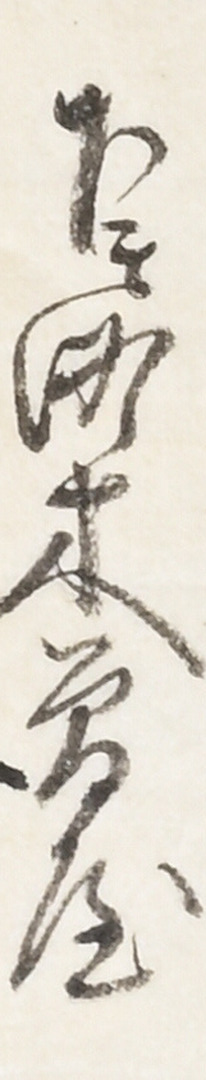下モ町木曽屋
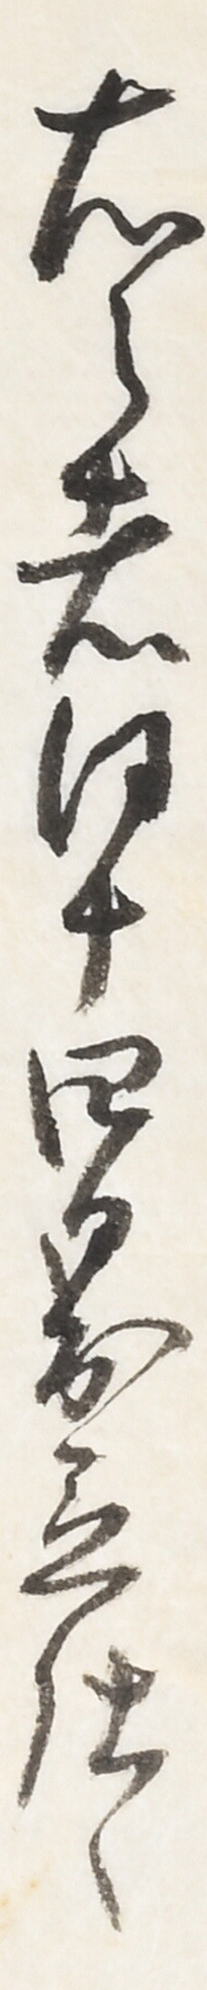右之者同十四日出立仕候
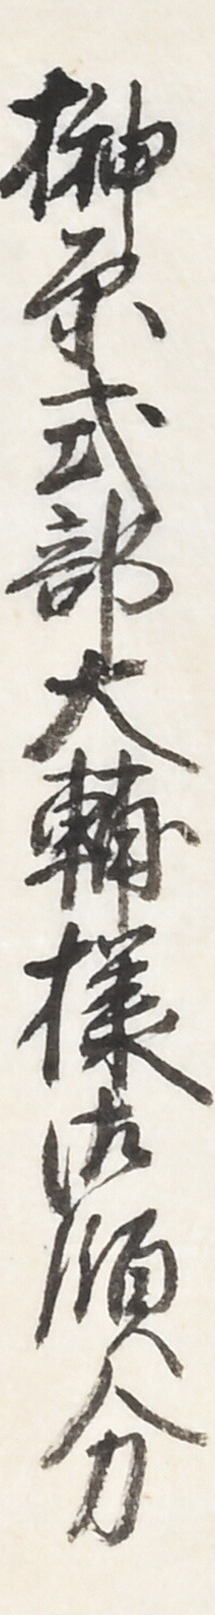榊原式部大輔様御領分
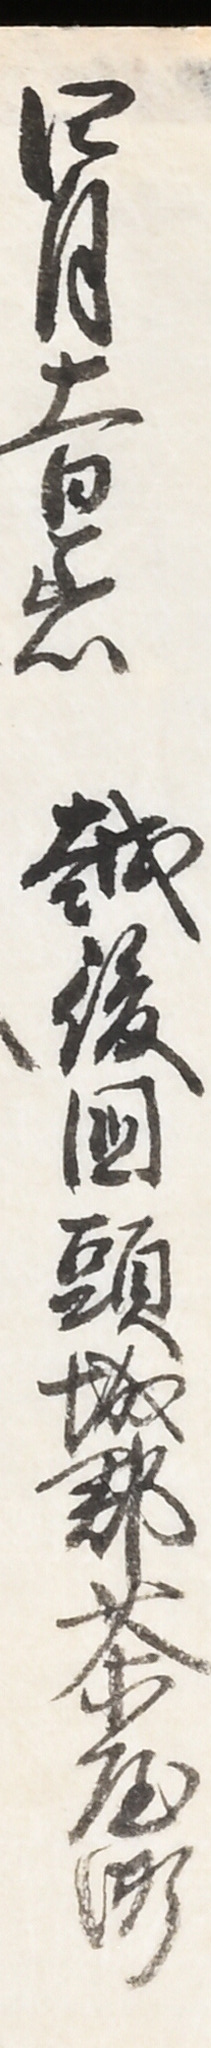四月十一日着越後国頸城郡茶屋町
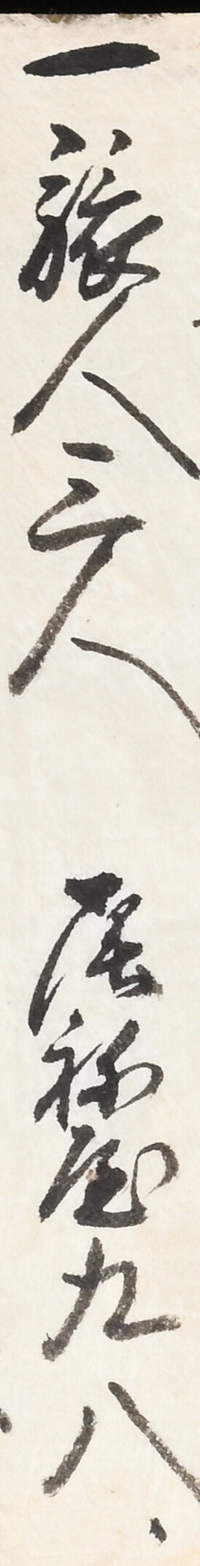一旅人三人屋祢屋九八・
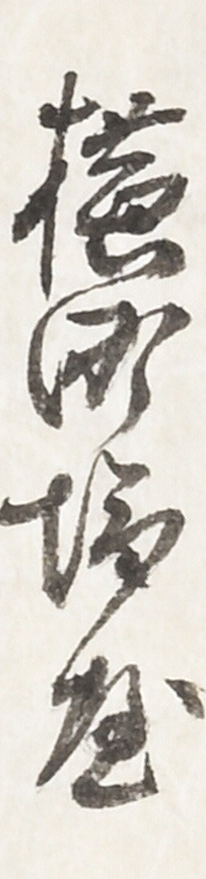横町塩屋
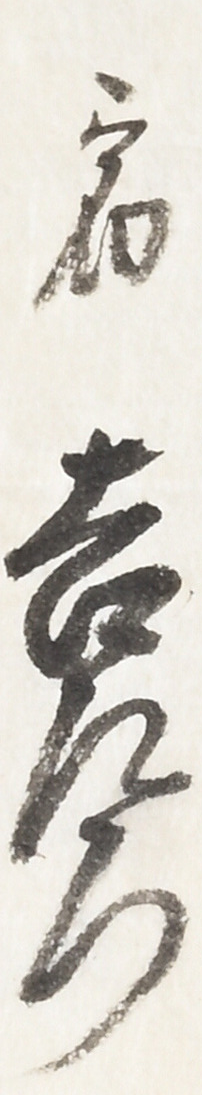宿吉左衛門
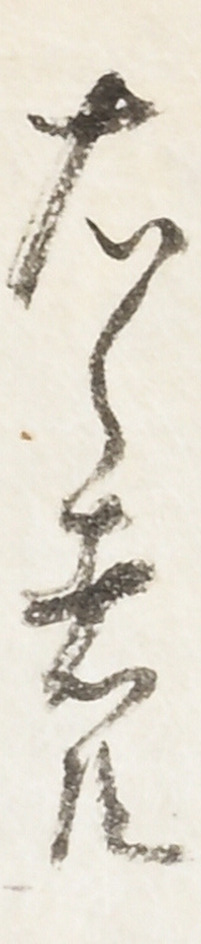右之者ハ
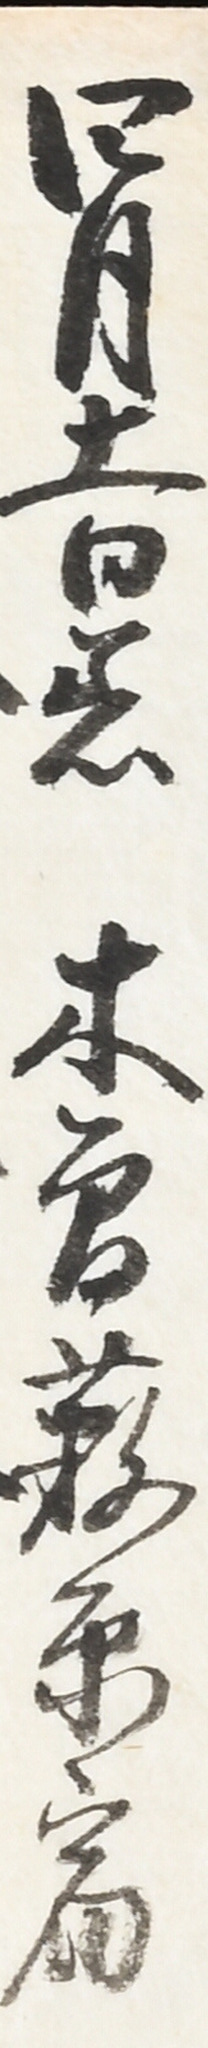四月十一日着木曽藪原宿
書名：旅人泊控帳
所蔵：伊那市立高遠町図書館・合同会社AMANE
